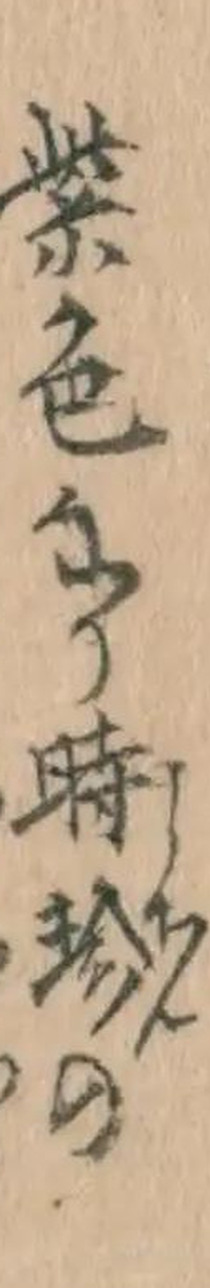紫色なり時珍の
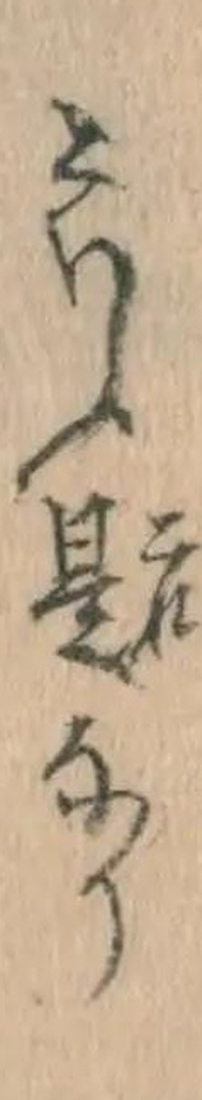といふ是なり

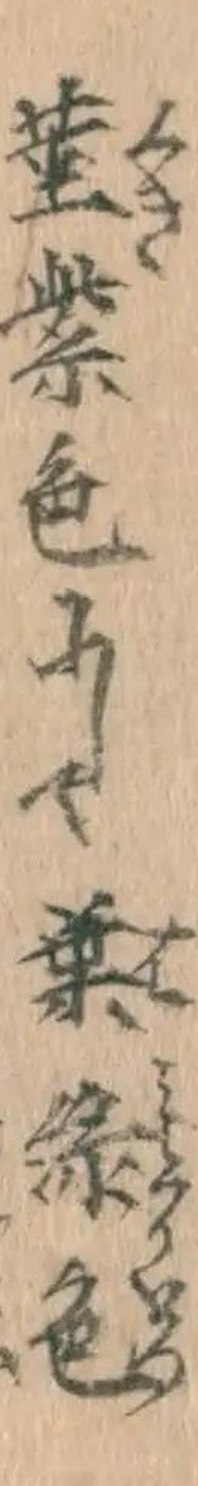茎紫色にして葉緑色
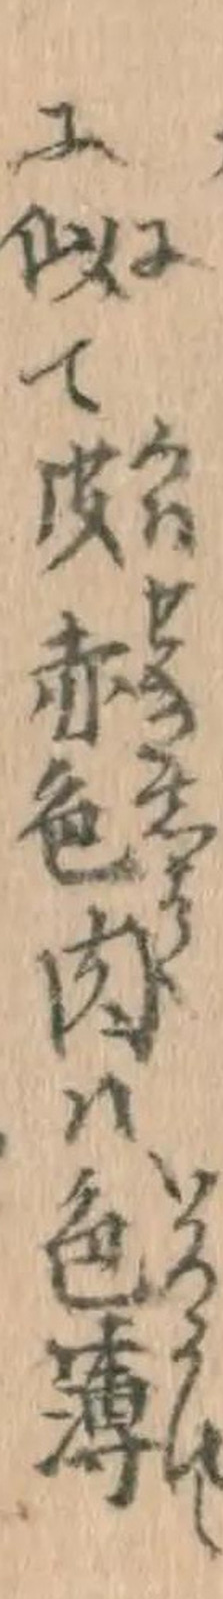に似て皮赤色肉は色薄
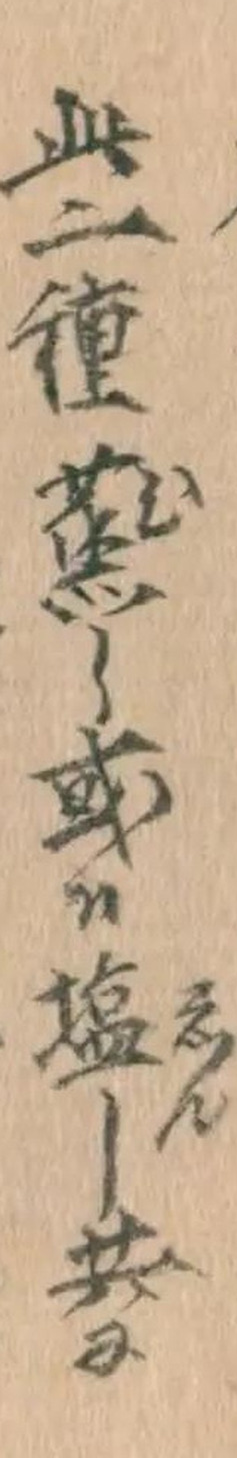此二種蒸し或は塩し共に
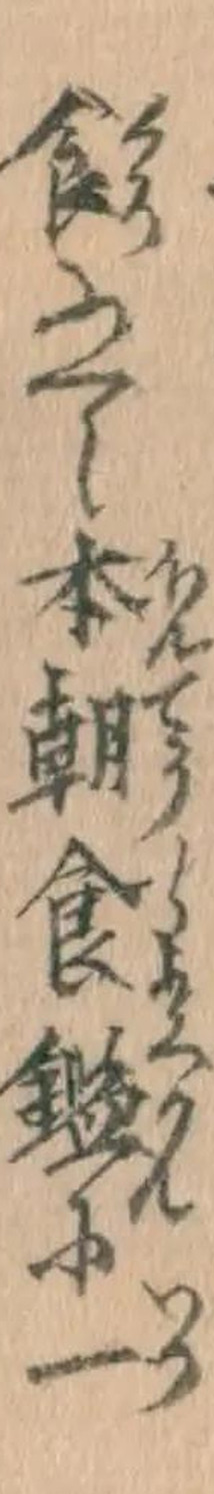食ふへし本朝食鑑に一
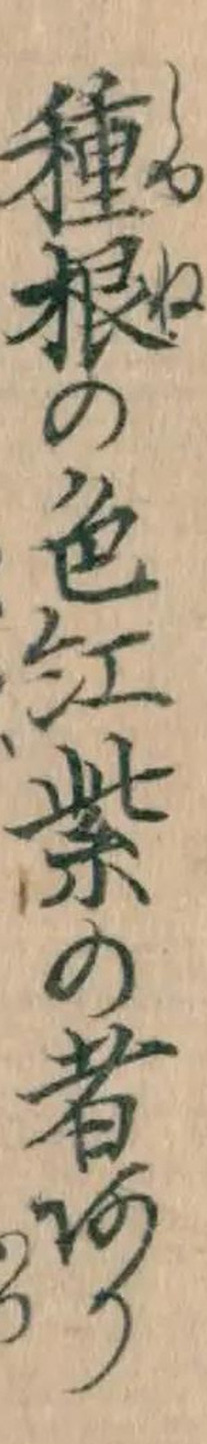種根の色紅紫の者あり
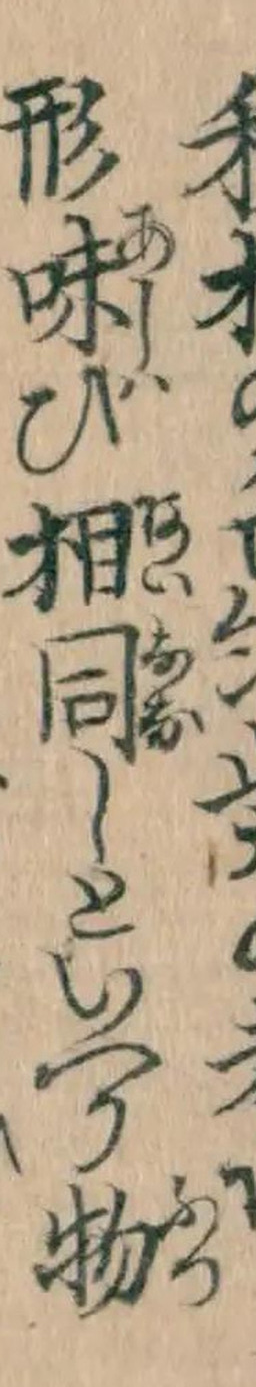形味ひ相同しといへり物
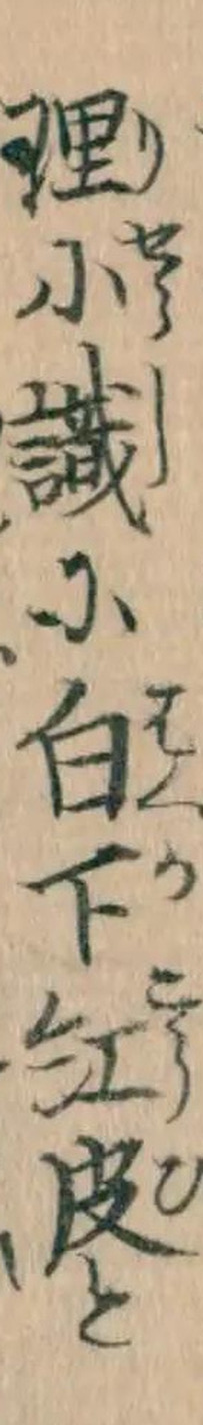理小識に白下紅皮と
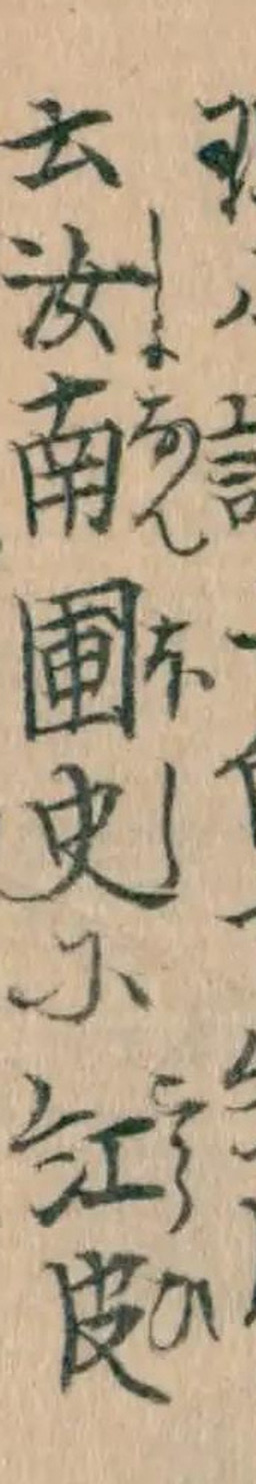云汝南圃史に紅皮

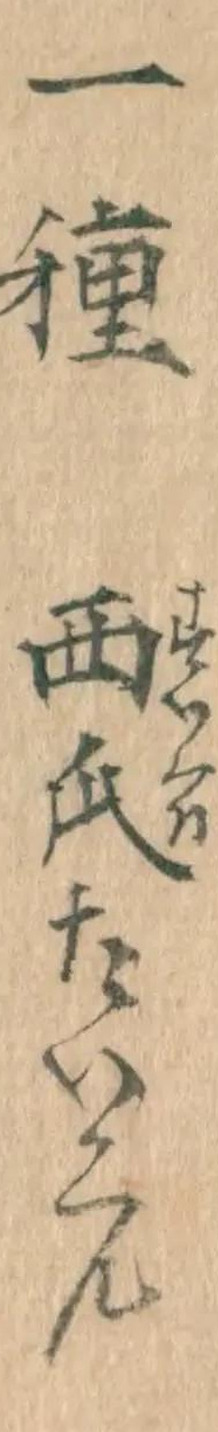一種西瓜たいこん
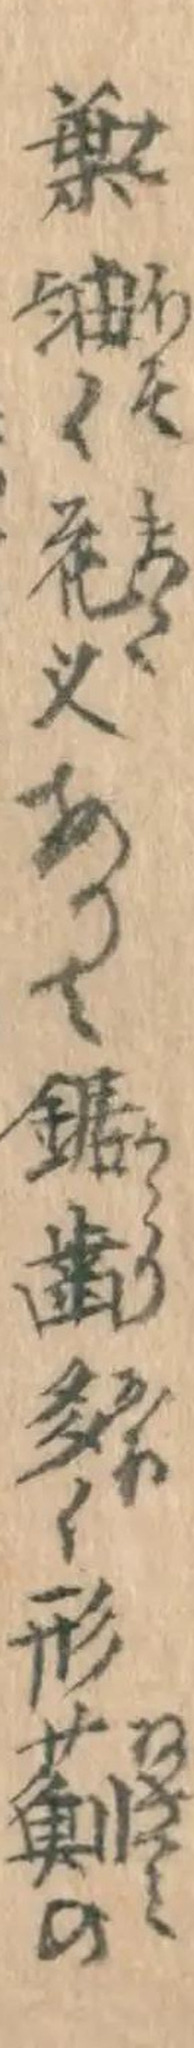葉細く花叉ありて鋸歯多く形薊の
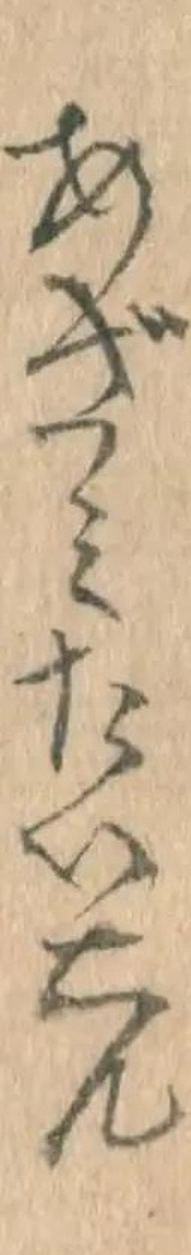あざみたいこん
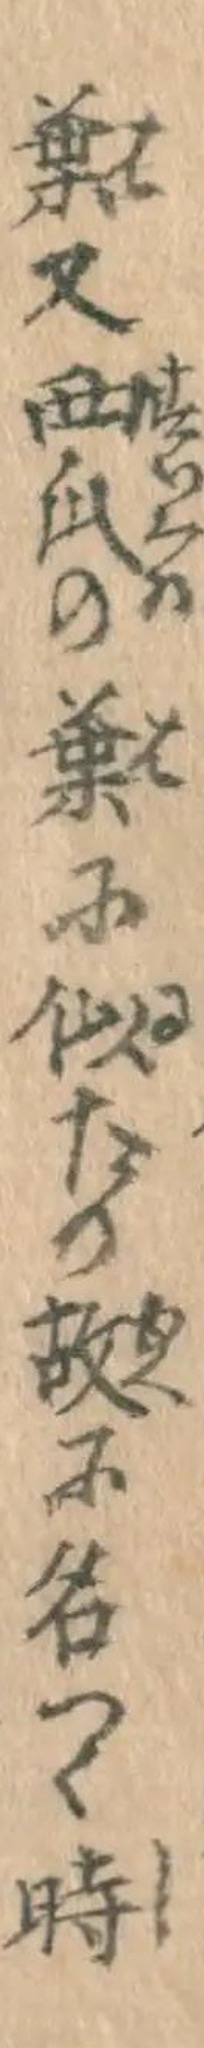葉又西瓜の葉に似たり故に名つく時
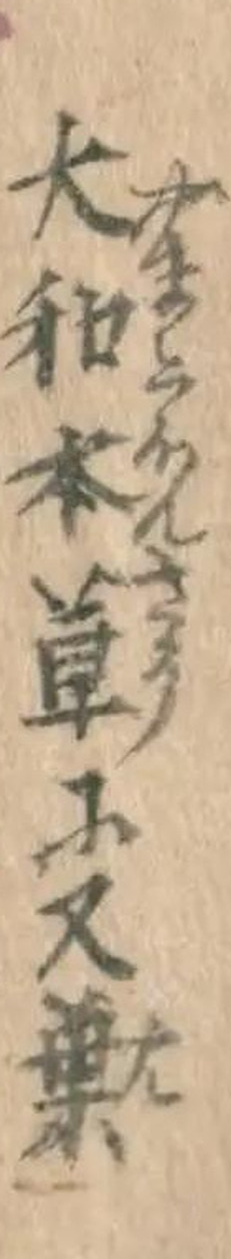大和本草に又葉
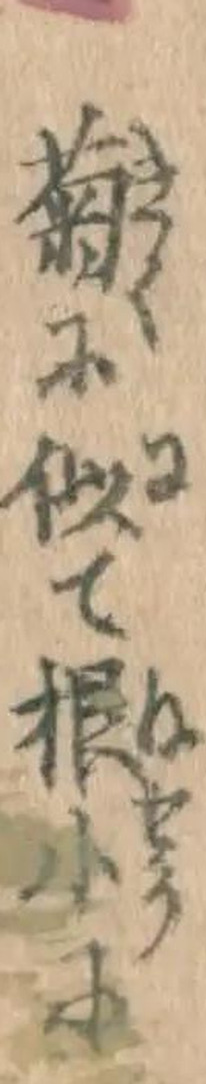菊に似て根小に
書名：本草図譜. 巻46-48
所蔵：国立国会図書館 National Diet Library, JAPAN
